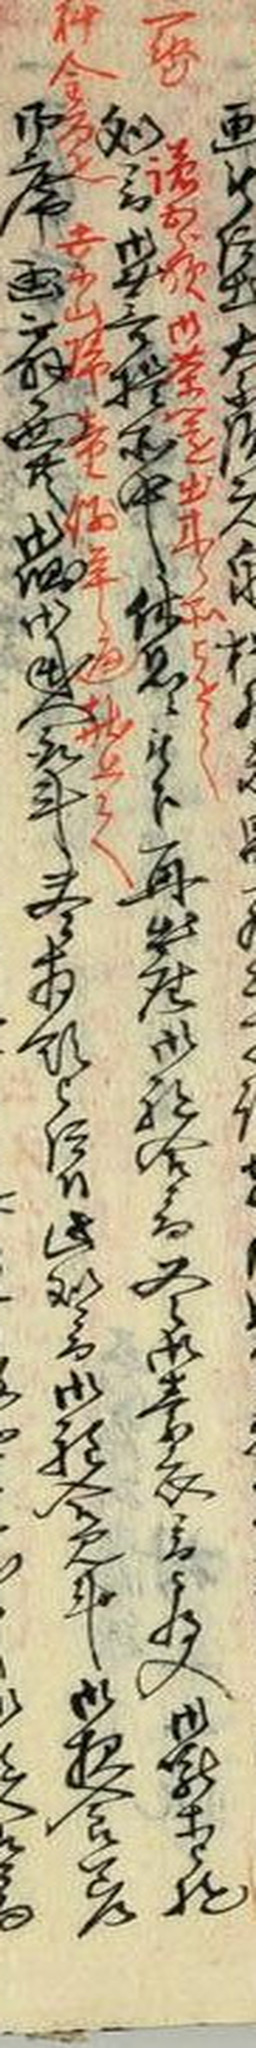御席画扇面共御側御用人取計夫々拝領被仰付此処ニ而御程合見計御夜食差
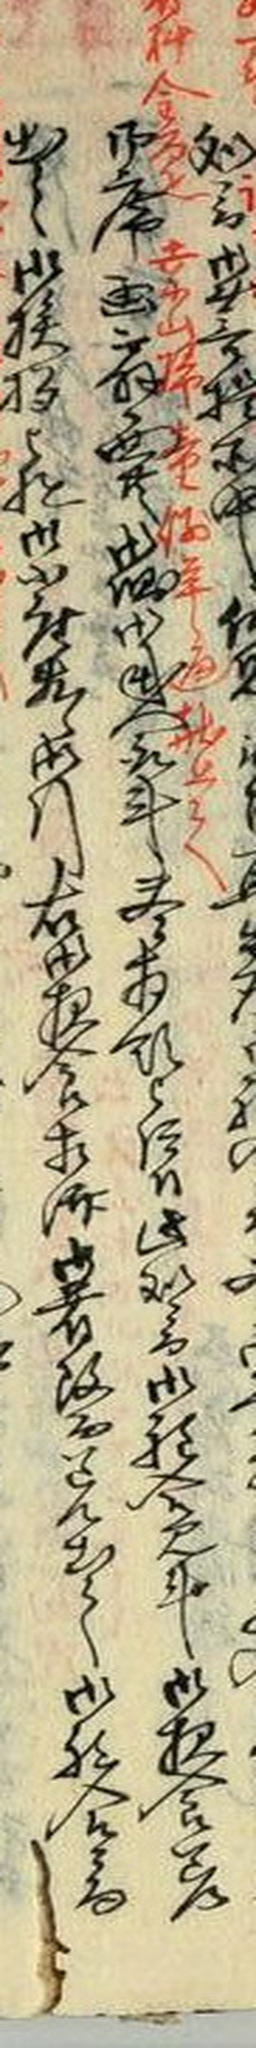出之御挨拶被遊御小座敷へ御引右御夜食相済御肴改而差出之御程合ニ而
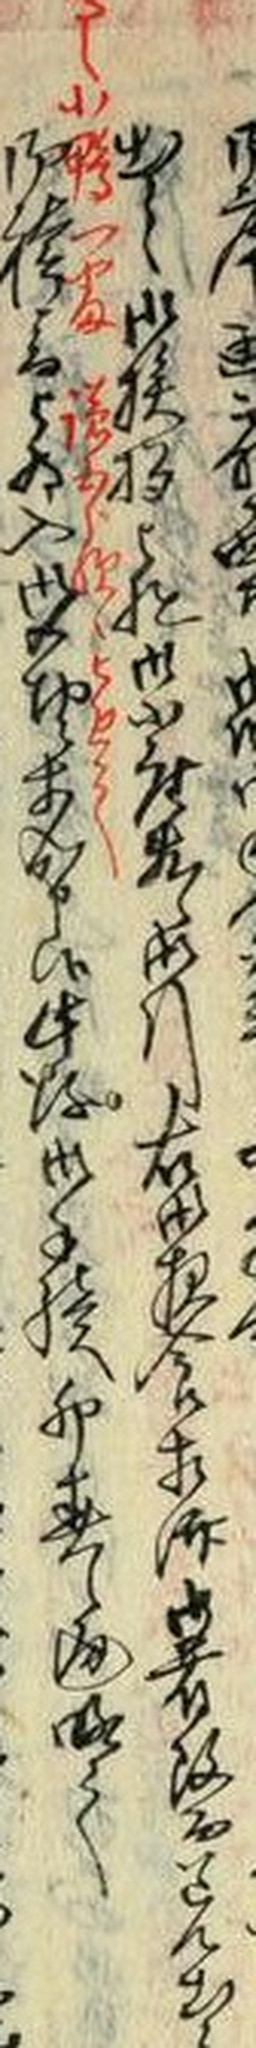御袴ニ而被為入御〆切ニ相成申候此後御手続卯春之通略之
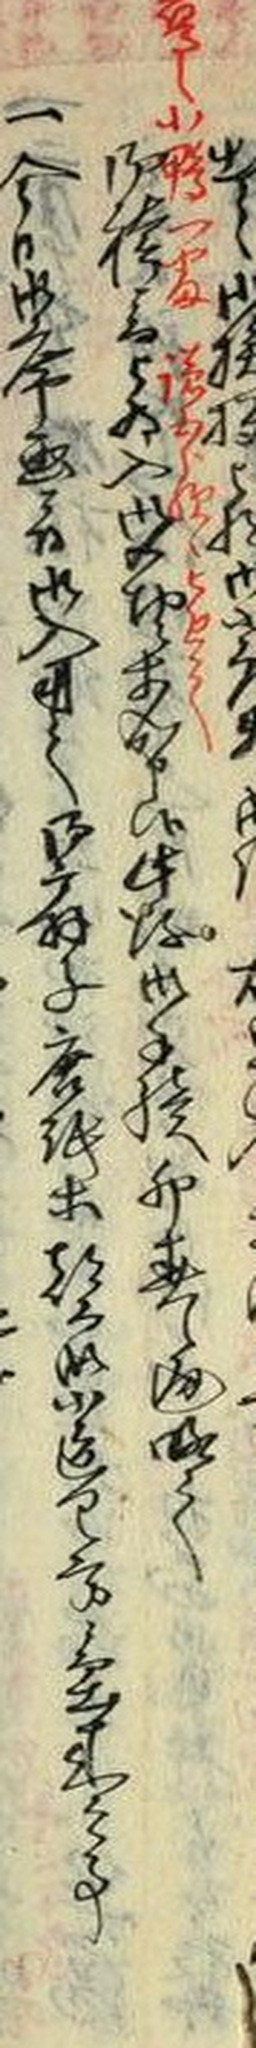一今日御席画ニ付御入用之御扇子唐紙等都而御小道具方ニ而出来之事
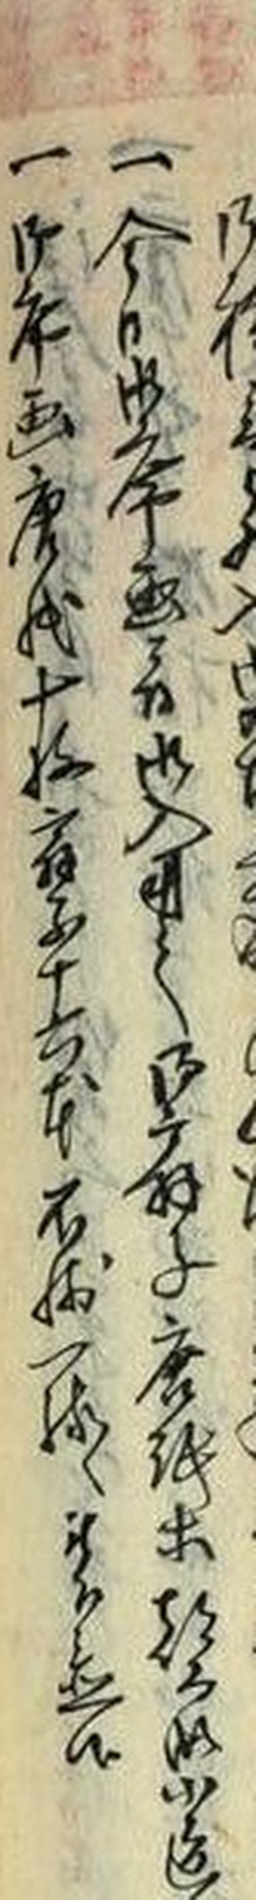一御席画唐紙十枚扇子十六本不残一統へ被下置候
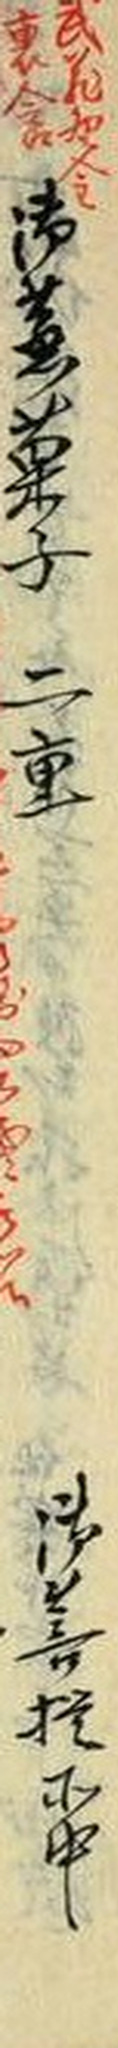御蒸菓子二重御菩提所中
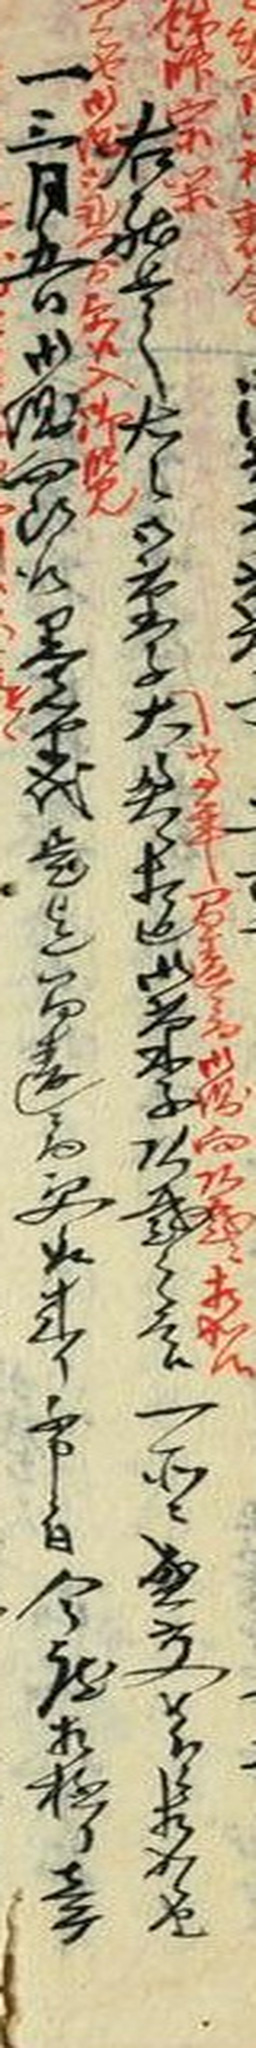一三月五日御側向頭取墨筆代是迄間違ニ而受取来り不申ニ付今度相極り壱ケ
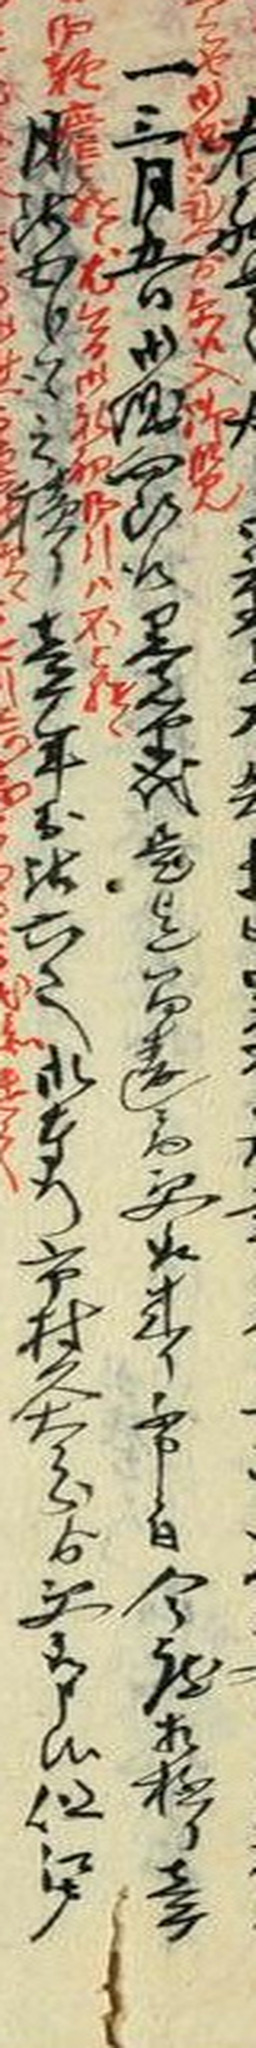月銀五分ツヽ之積り壱ケ年分銀六匁御奉行市村久太郎ゟ受取申候但江戸
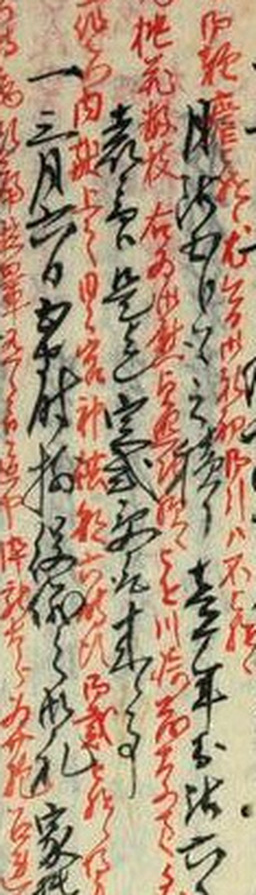表ニ而ハ是迄定式受取来候事
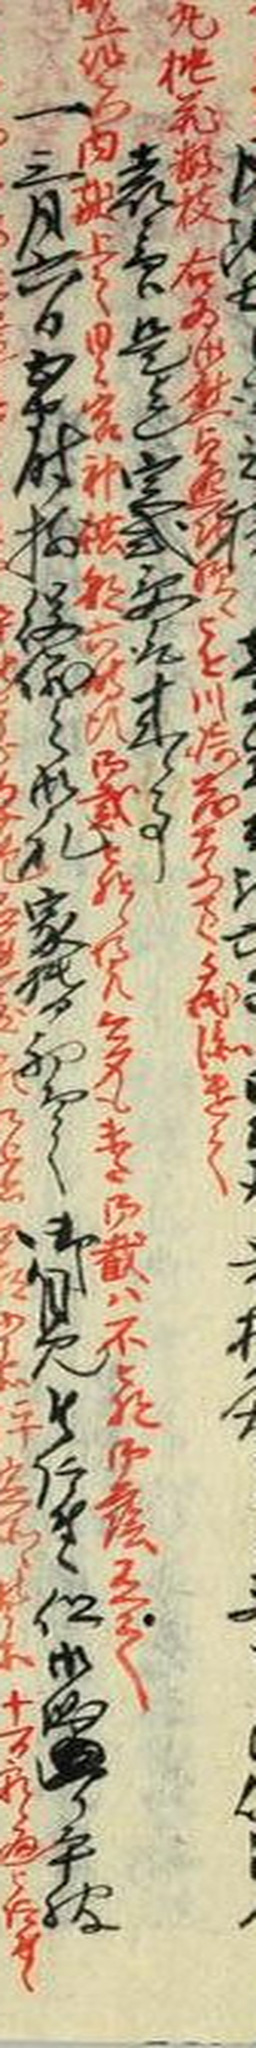一三月六日五半時揃役儀之御礼家督初而之御目見被仰付候但御側廻り平服
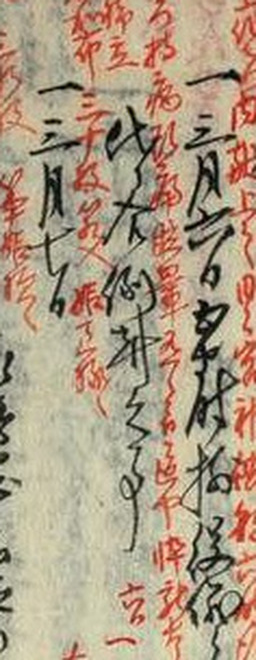代り合例刻之事
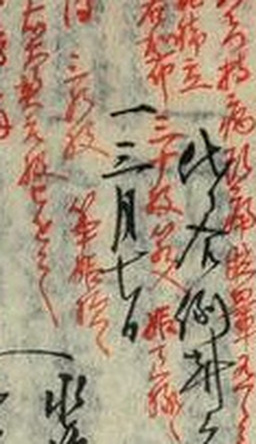一三月七日
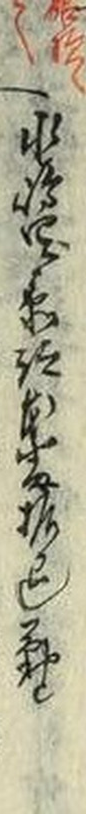水嶋四郎兵衛跡本番振退勤被
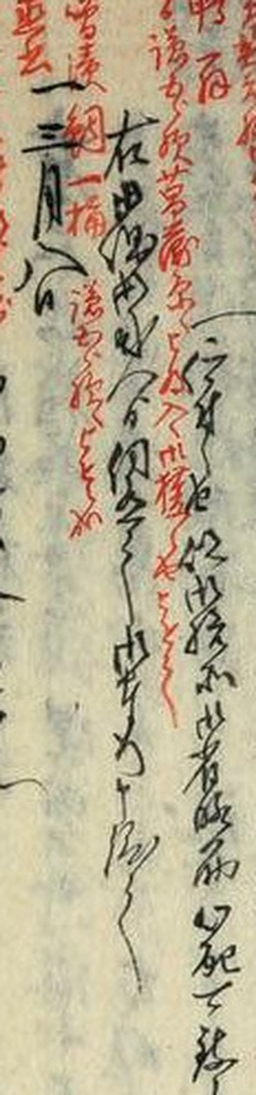右御側御用人ゟ伺有之御奉行申渡之
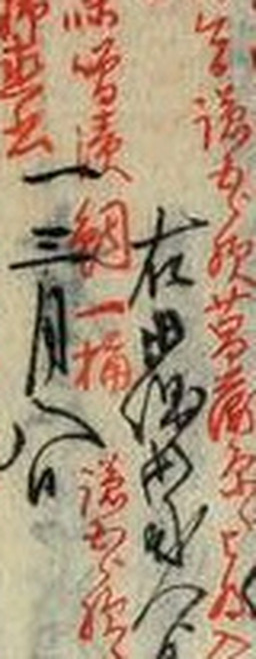一三月八日
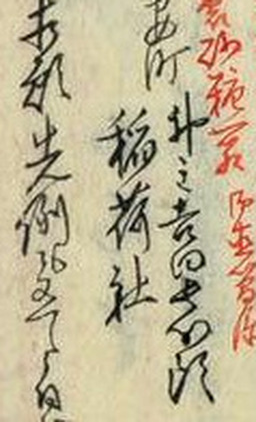稲荷社
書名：少傅日録抄（斉承付側向頭取日記、在国）
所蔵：福井県文書館 Fukui Prefectural Archives
